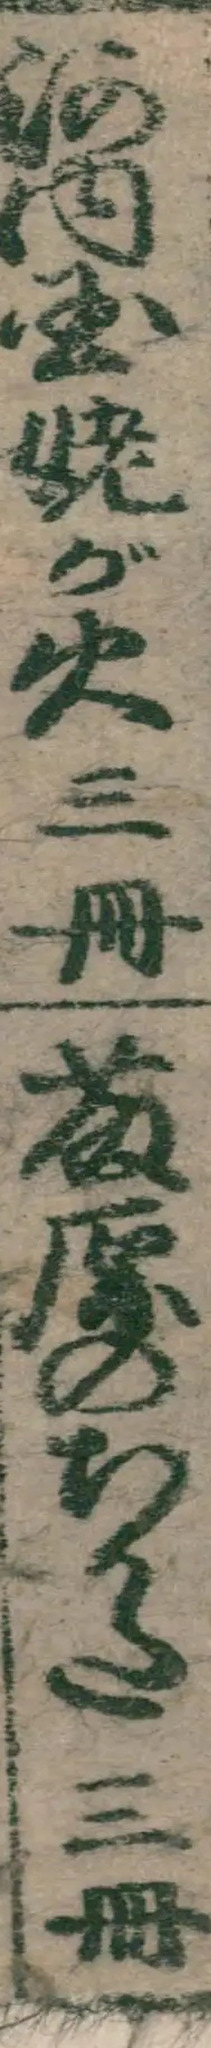河内国姥が火三冊藤原のちかた三冊
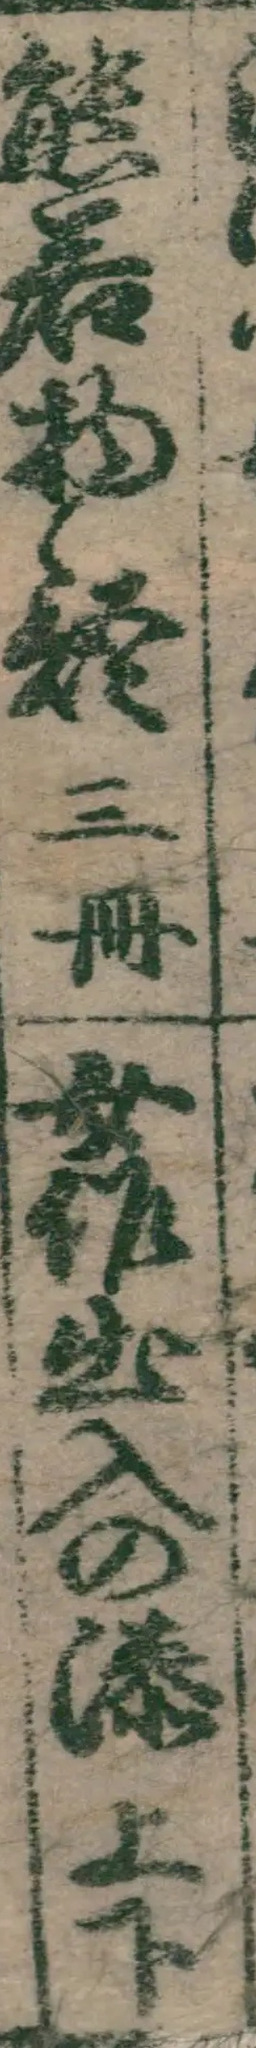熊若物語三冊女作出入の湊上下
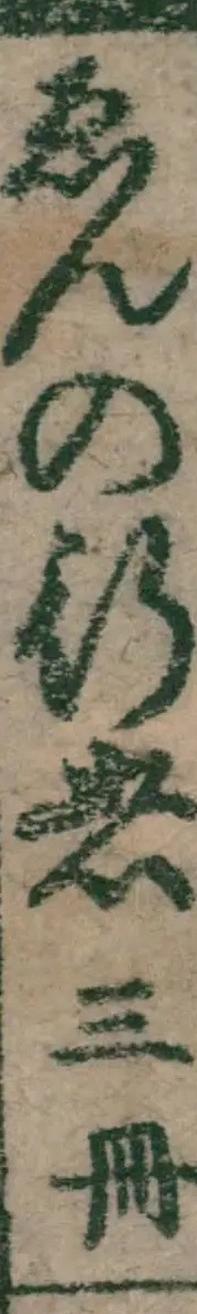ゑんの行者三冊
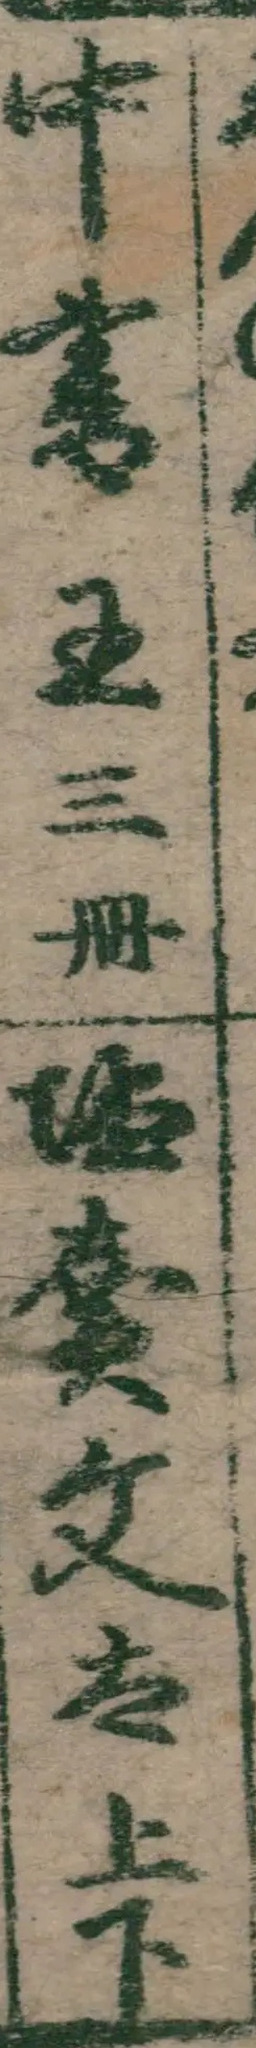中書王三冊塩売文太上下
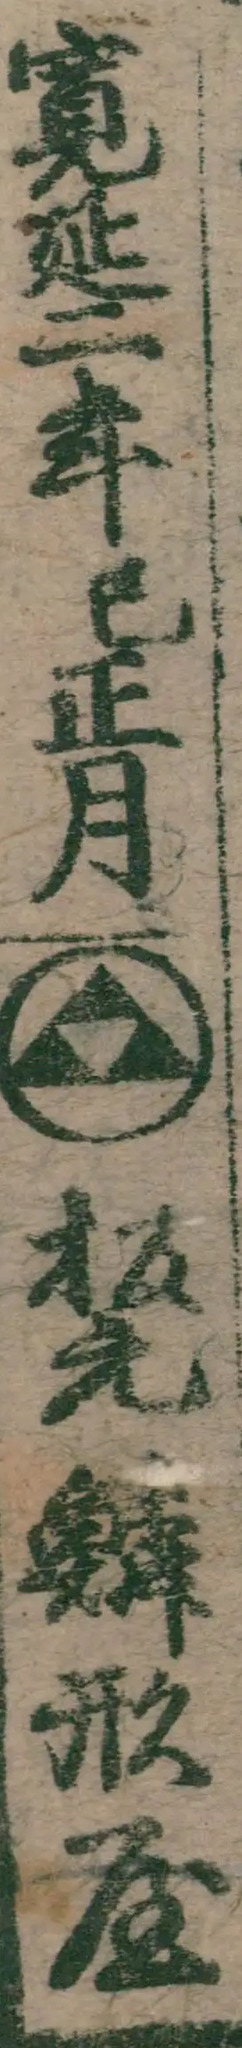寛延二年巳正月板元鱗形屋
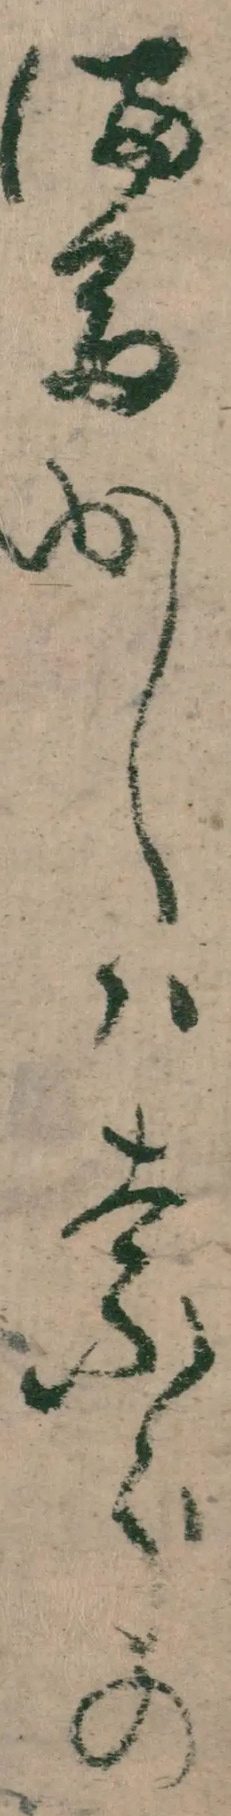またかしはならの
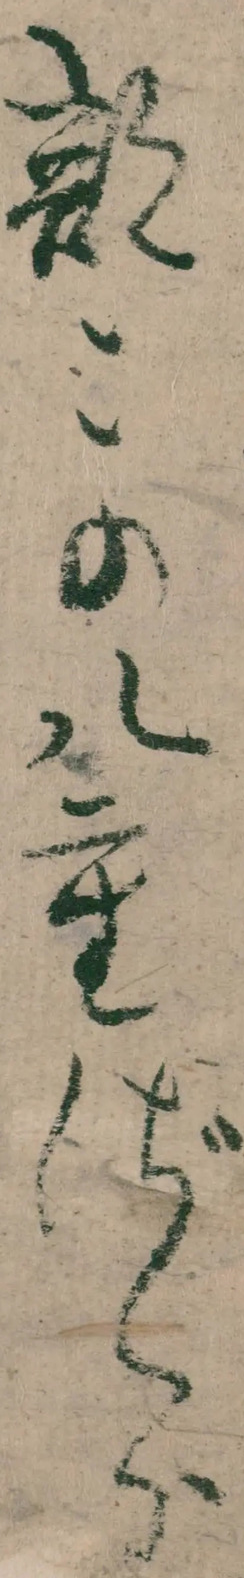都この八重ざくら
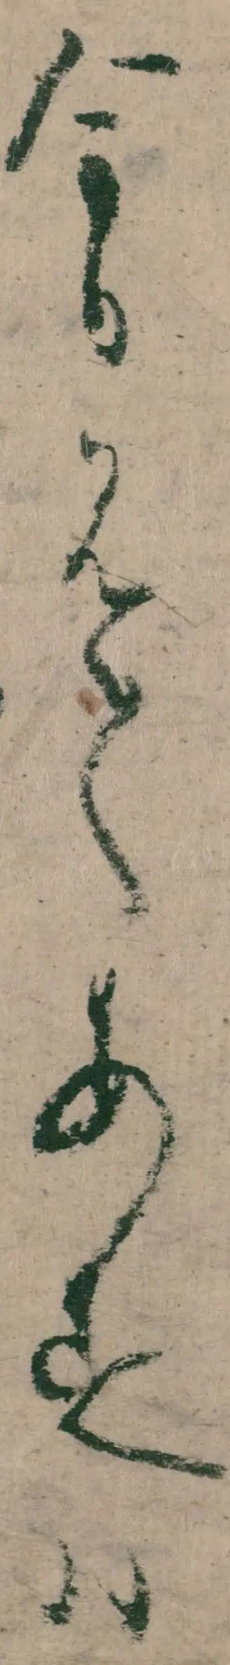今日見てあすは
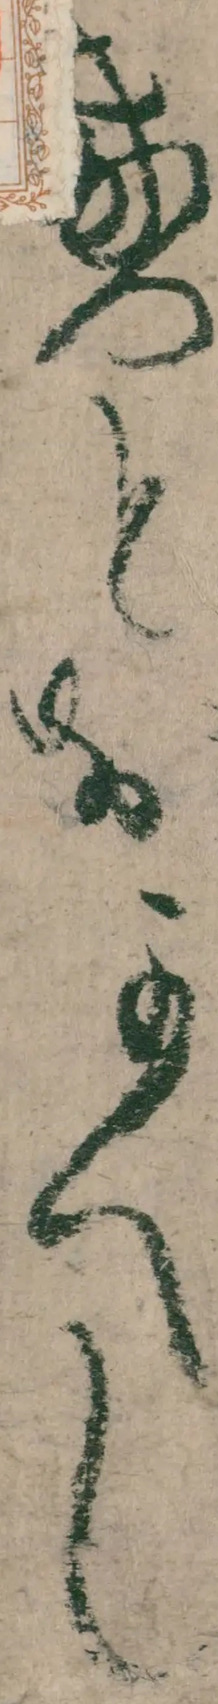きつとおかへし
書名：塩売文太物語 2巻
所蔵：国立国会図書館 National Diet Library, JAPAN
